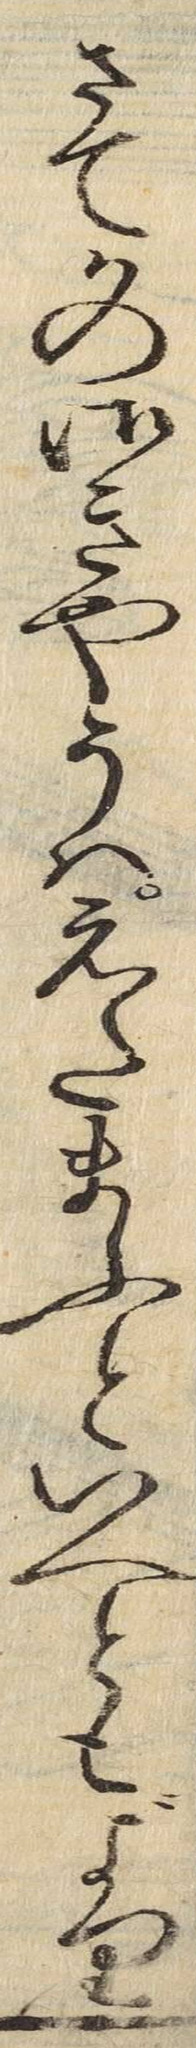さてかの御きやうはえたまふといへともより
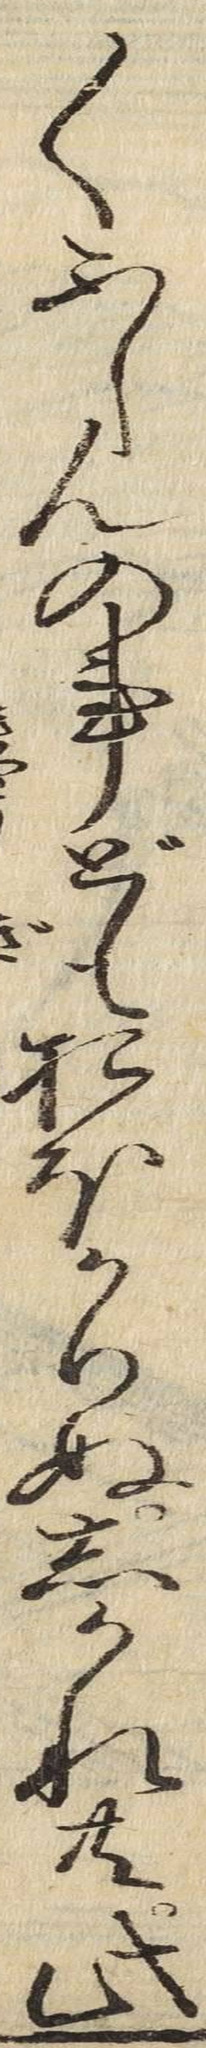〳〵ふしんの事どもおほかりぬ。しかれ共。此
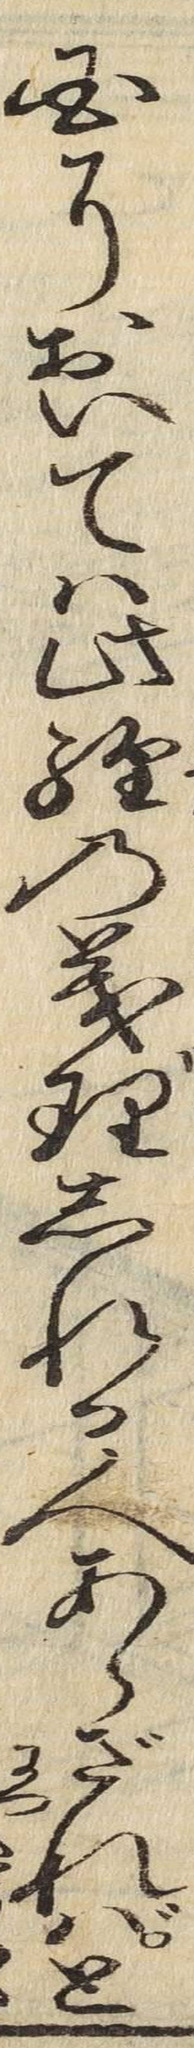国においては此経の義理しれる人あらざれば。と
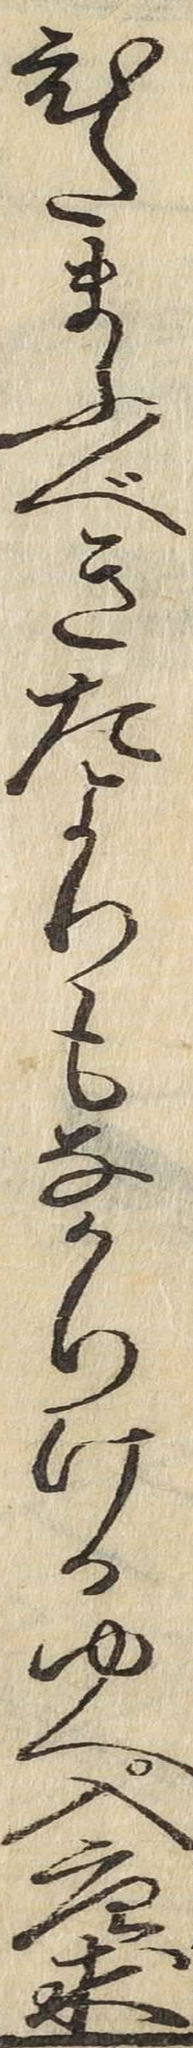ひたまふべきたよりもなかりけるゆへ。入唐求
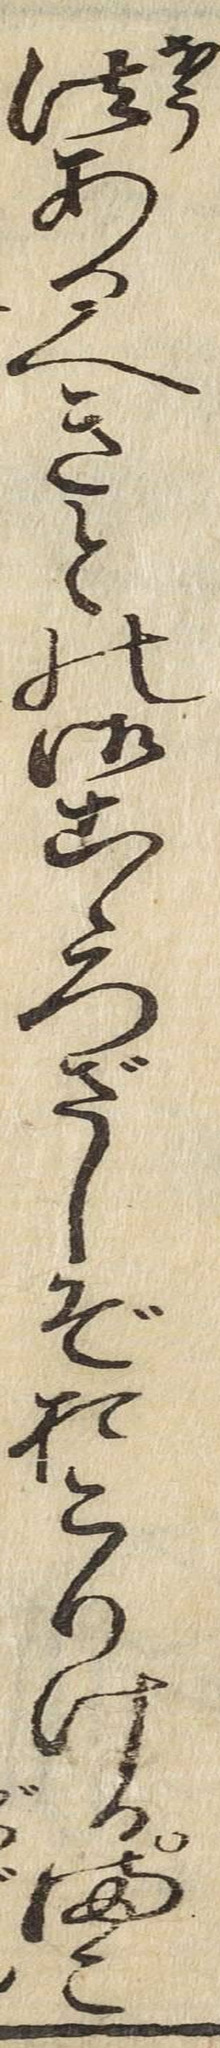法あるへきとの御こゝろざしぞおこりける。まこ
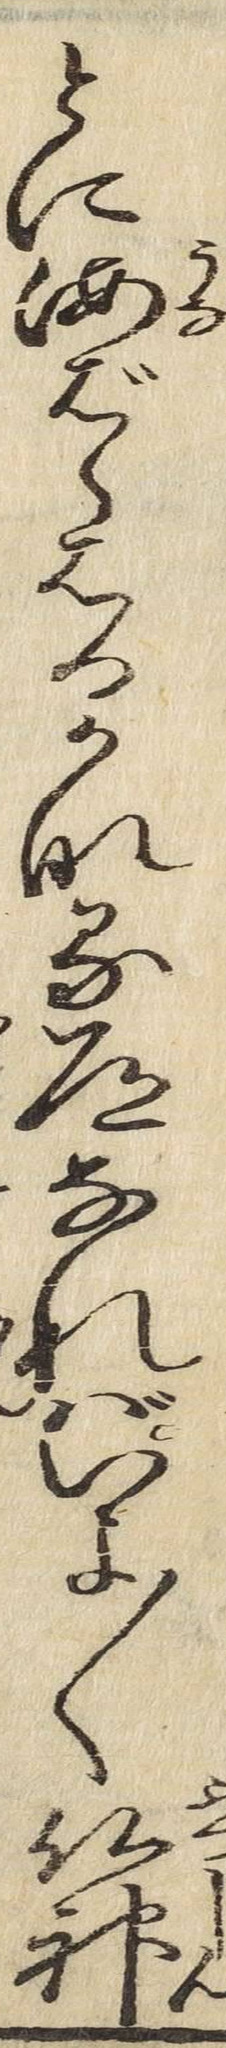とに海ばらはるかなる道なれば。いよ〳〵仏神
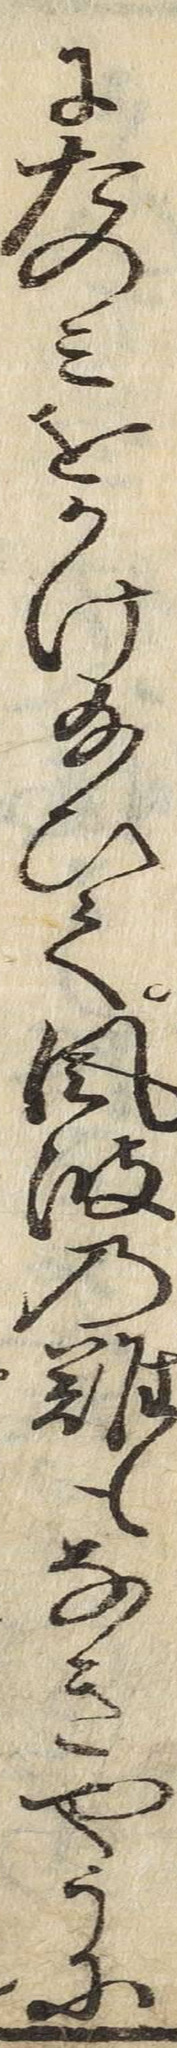にたのみをかけ給ひて。風波の難もなきやうに
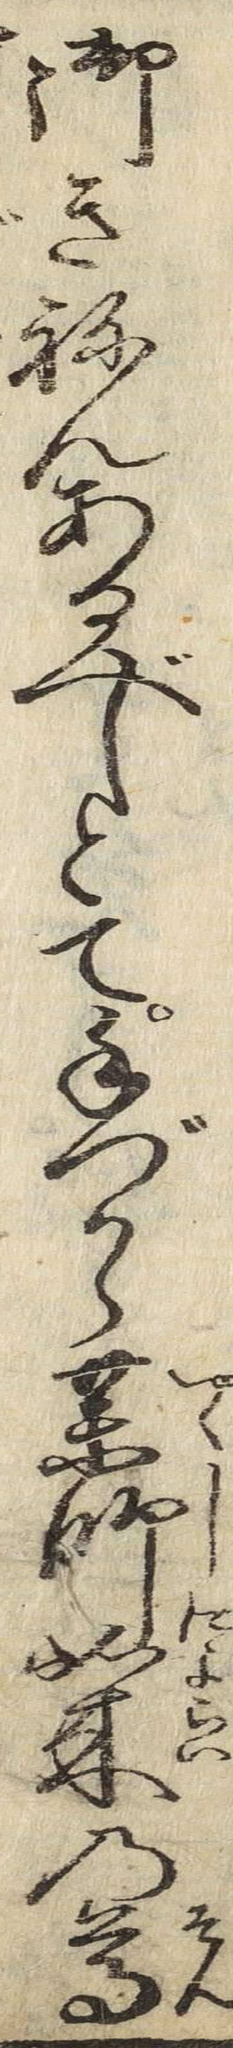御きねんあるべしとて。手づから薬師如来の尊
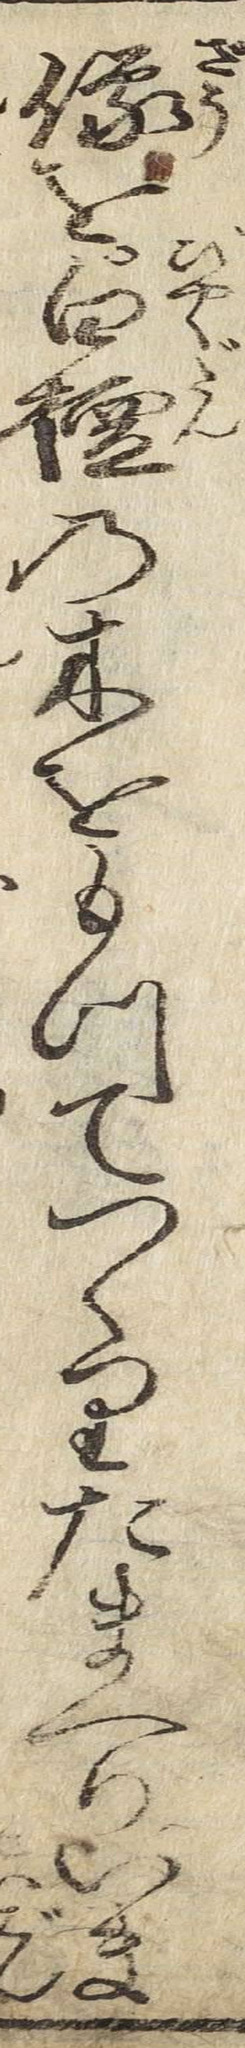像を白檀の木をもつてつくりたまへり。いま
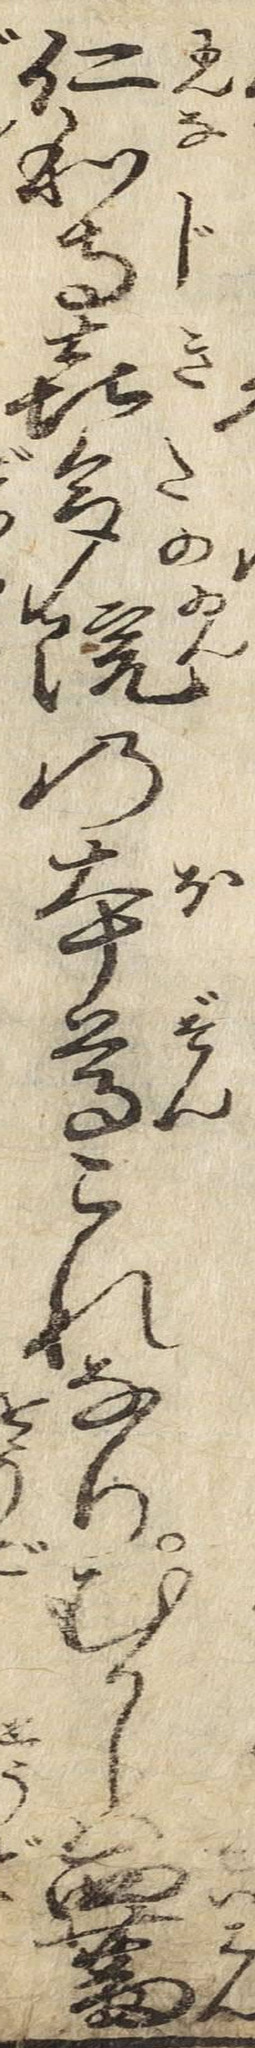仁和寺喜多院の本尊これなり。むかしは西蕃
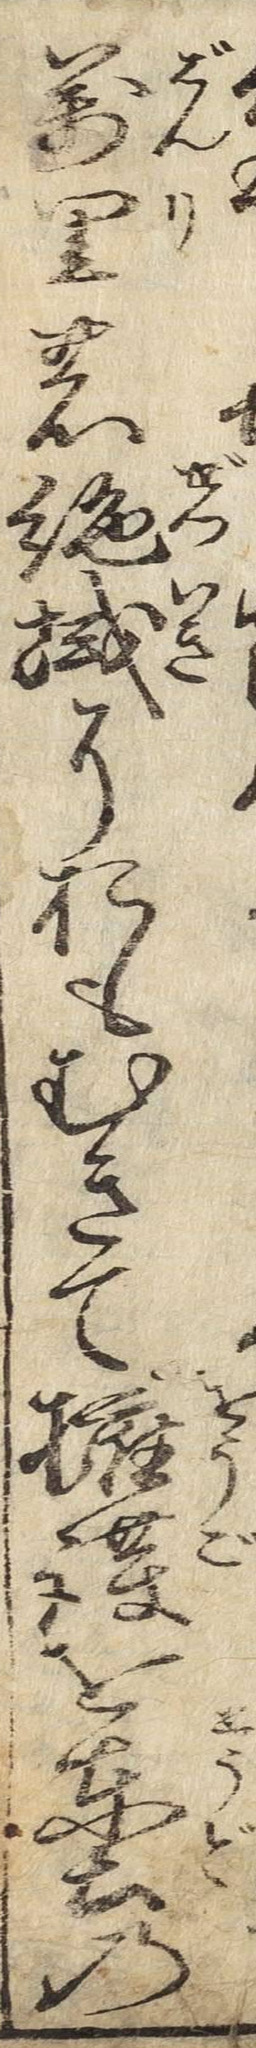万里の絶域におもむきて。擁護を東土の

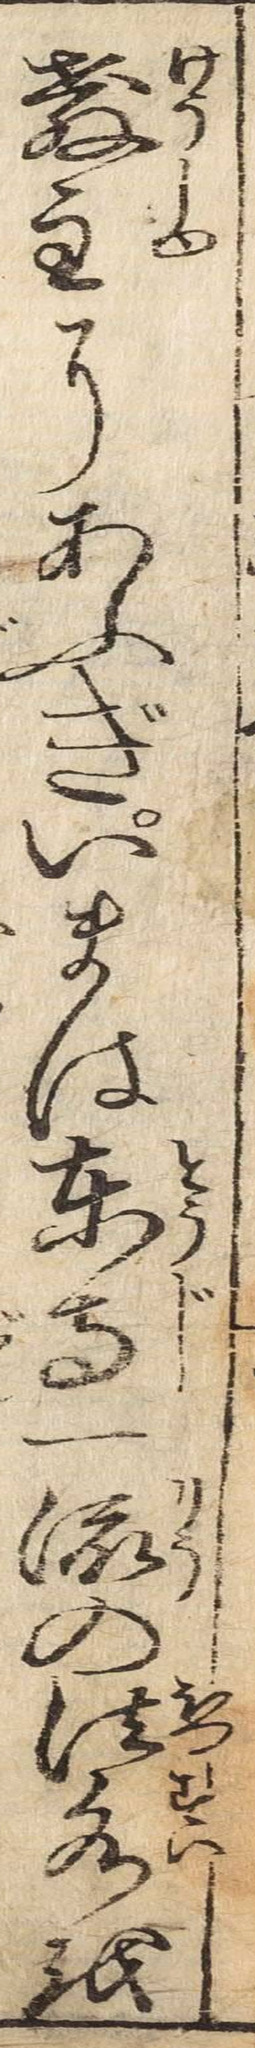教主にあふぎ。いまは東寺一流の法水を
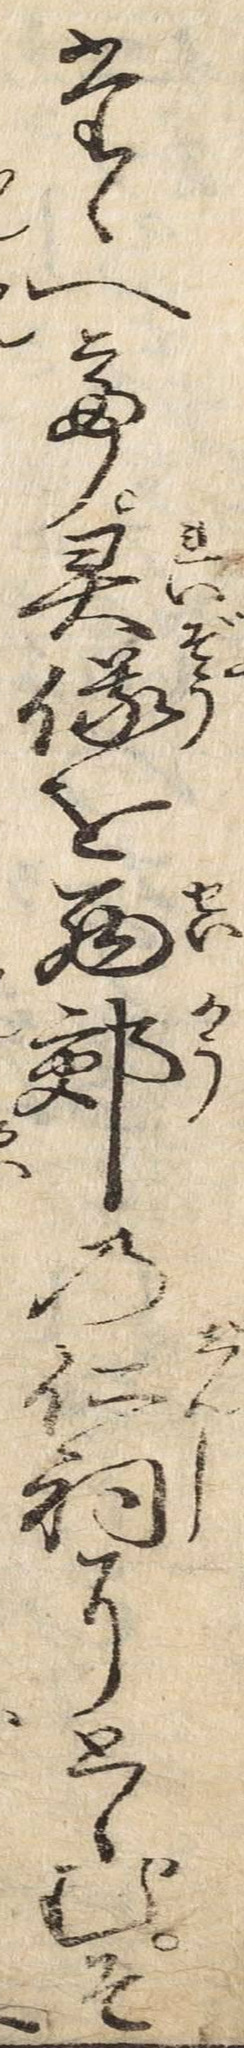たゝへて。霊像を西郊の仁祠にとゝむ。そ
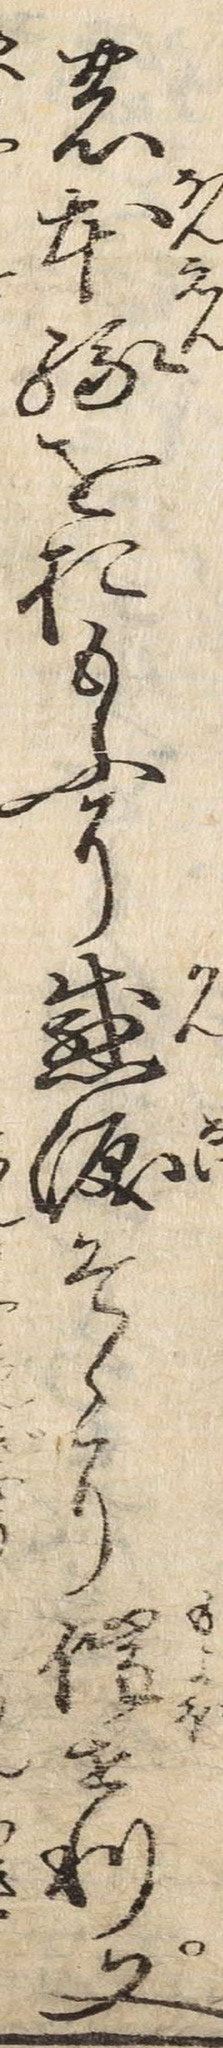の本縁をおもふに感涙そらに催せり。又
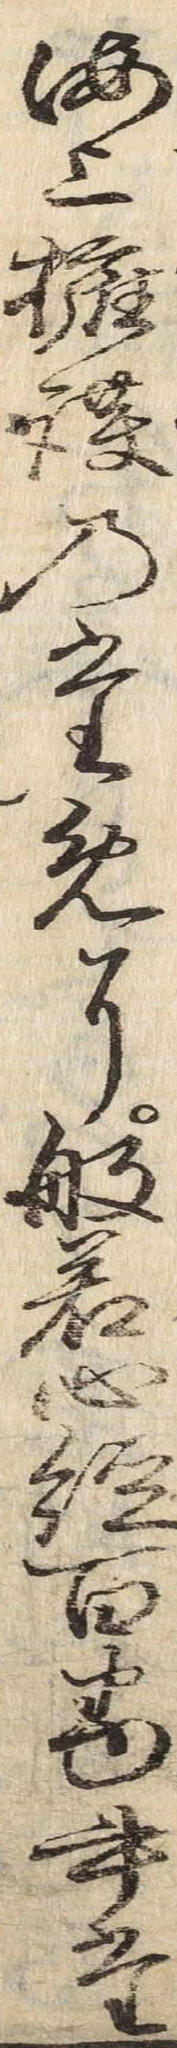海上擁護のために。般若心経百巻書た
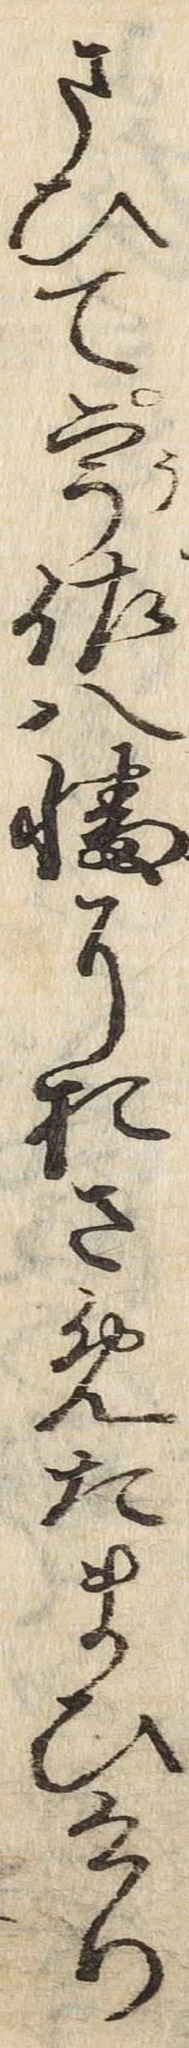まひて。宇佐八幡におさめたまひけり
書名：弘法大師御傳記
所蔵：京都府立京都学・歴彩館 国文学研究資料館
